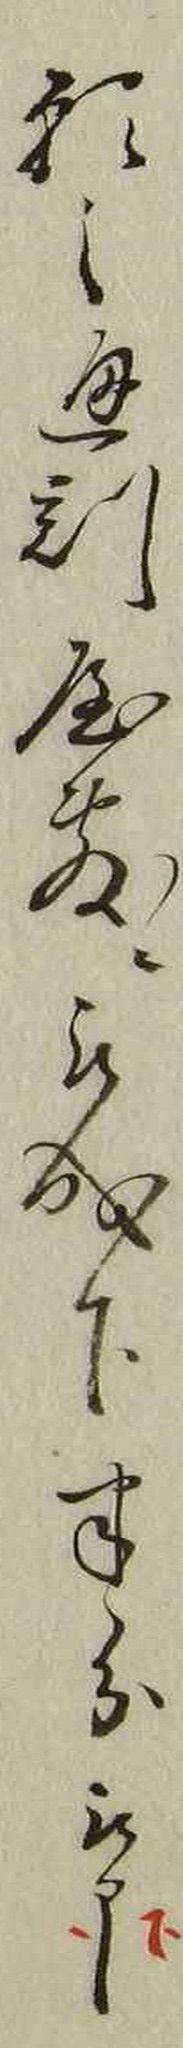願之通刻屋敷被成下半分被下
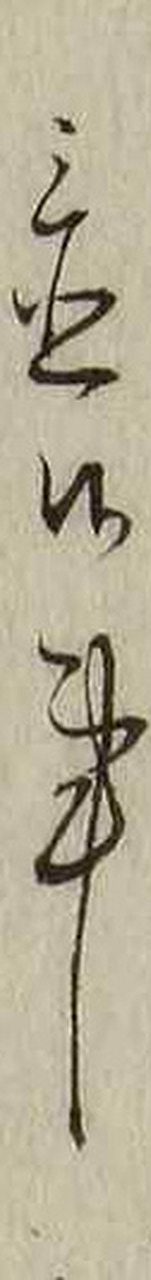置候事
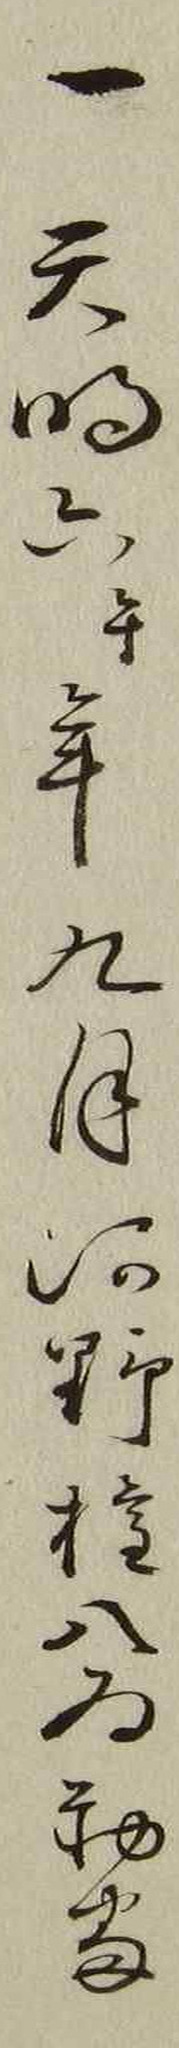一天明六午年九月河野権八為勤番
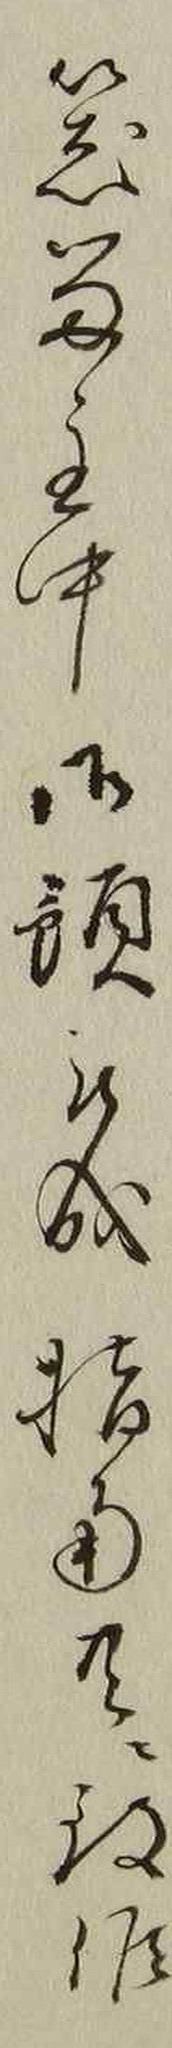器留主中御預被成指南共致候
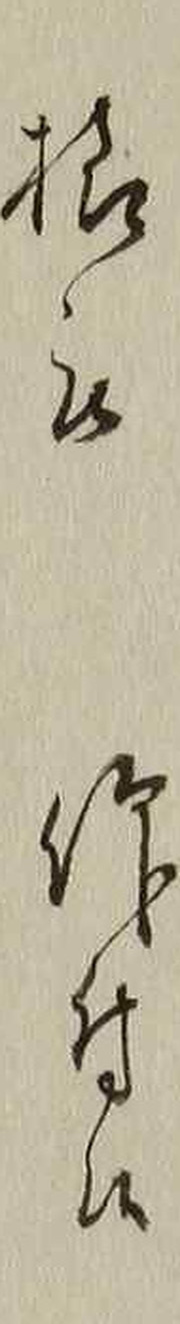様被仰付候
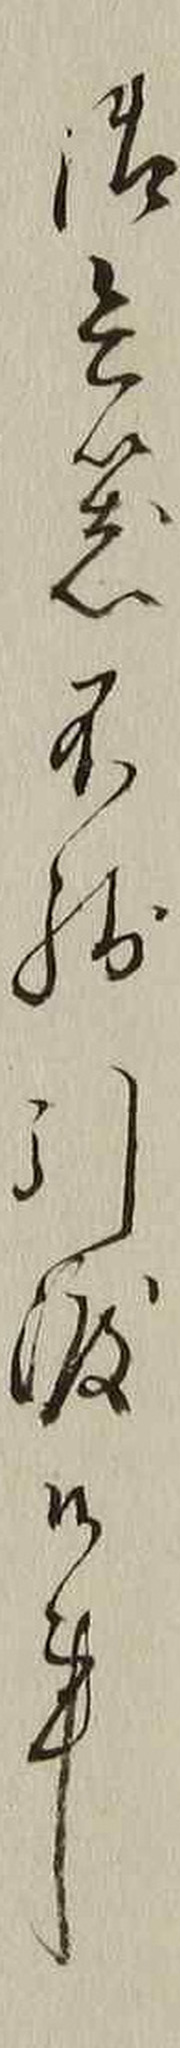御兵器不残引渡候事
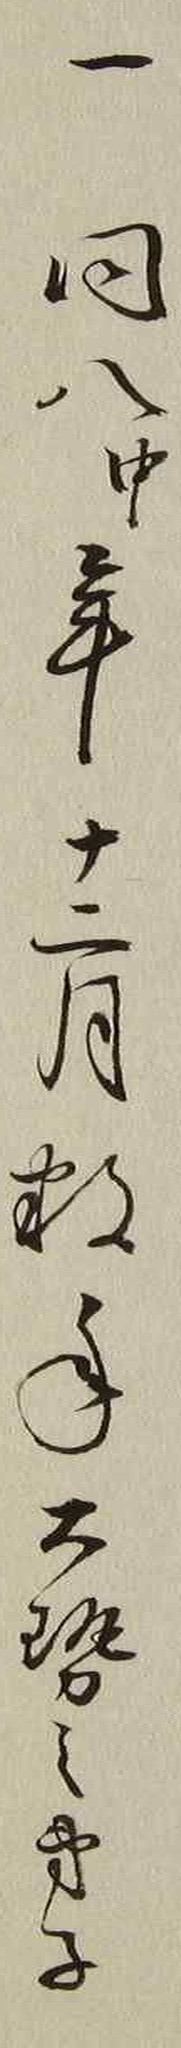一同八申年十二月数年大勢之弟子
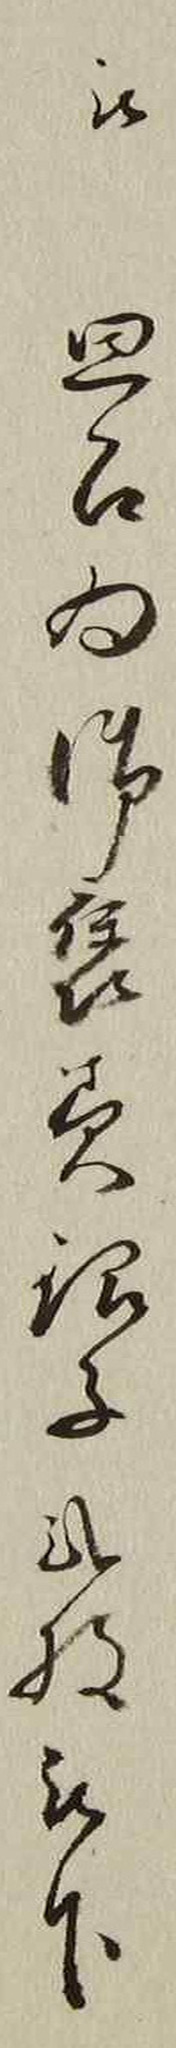被思召為御褒美銀子弐枚被下
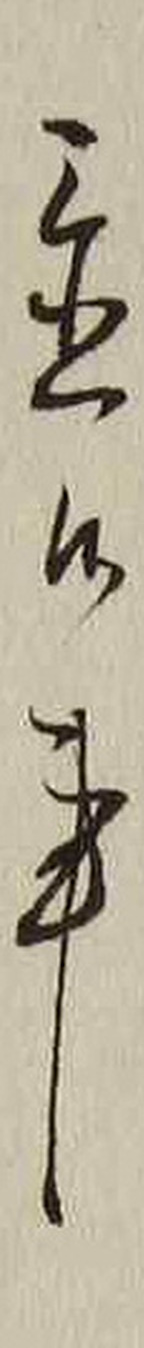置候事
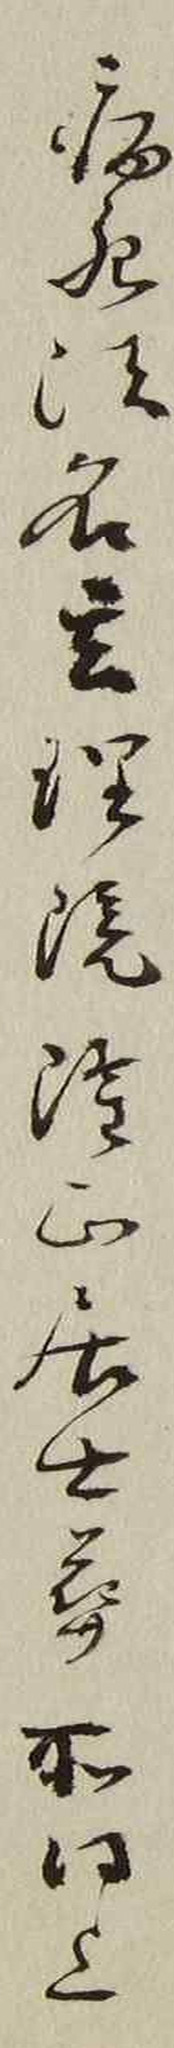病死法名玄理院隆正居士葬所同上
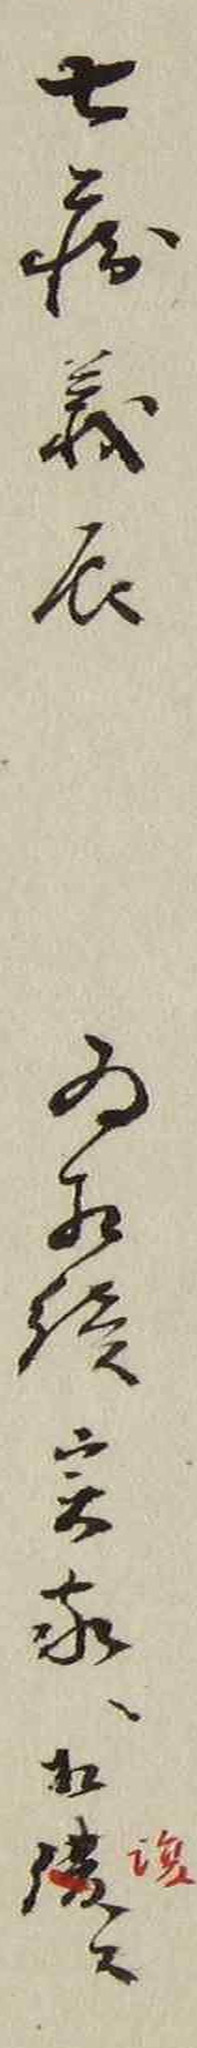七蔵義辰為相談実家へ相復ス

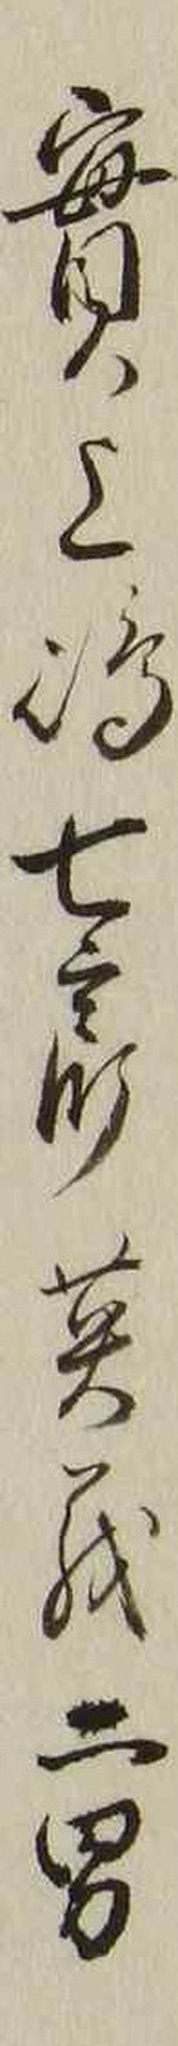実上崎七郎英茂二男
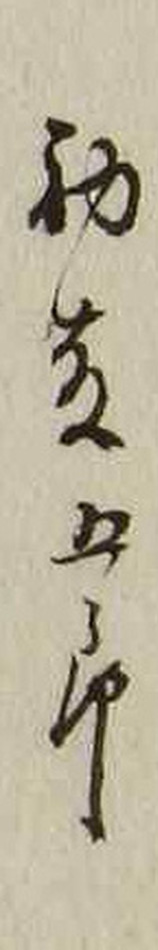初亥五郎
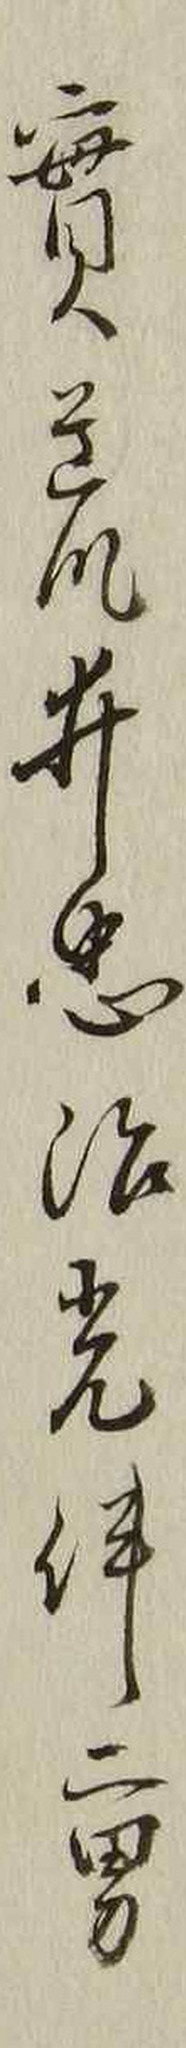実荒井忠治光伴二男
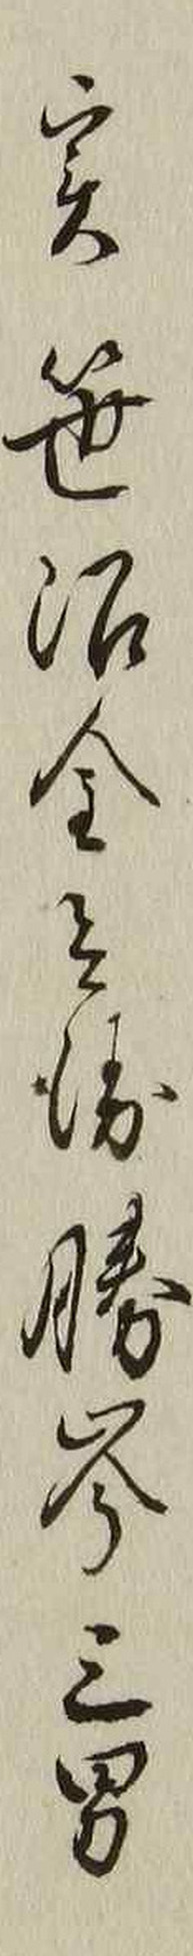実笹沼金兵衛勝岑三男
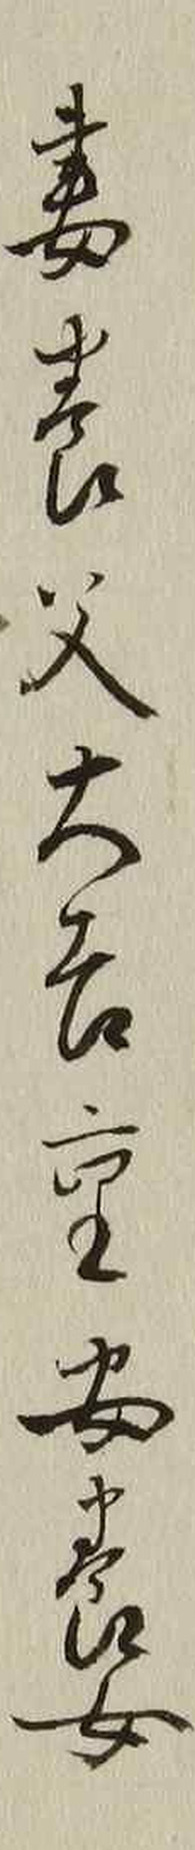妻養父大吉重安養女
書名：諸士系譜　巻之7　い之部7
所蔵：会津若松市立会津図書館
